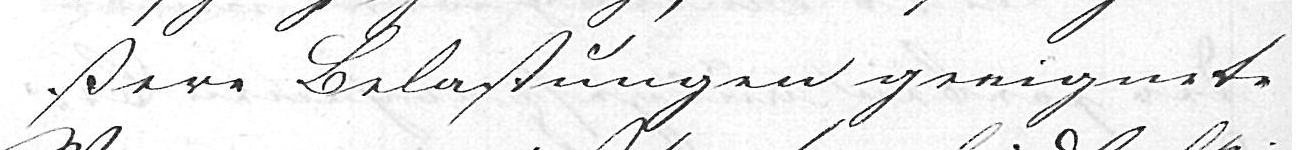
ßere Belastungen geeignete
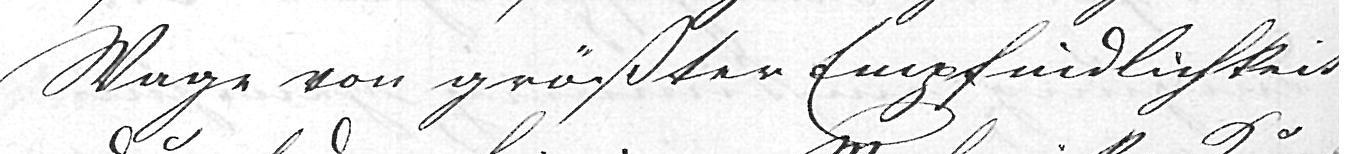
Wage von größter Empfindlichkeit
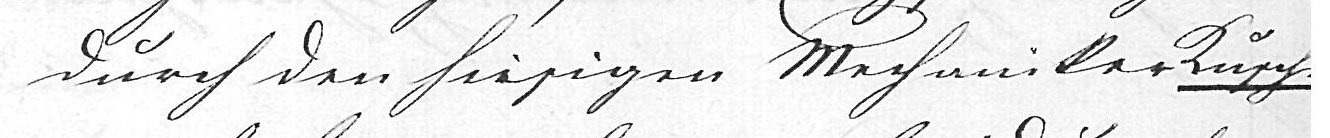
durch den hiesigen Mechaniker Kusch
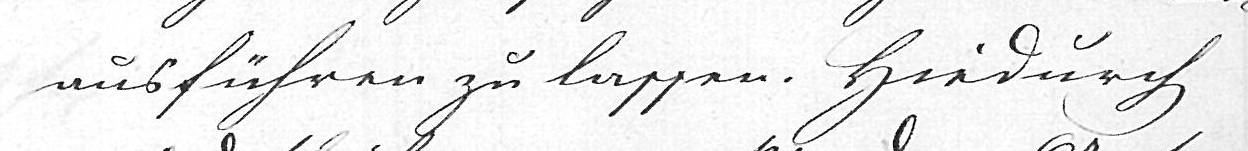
ausführen zu lassen. Hiedurch
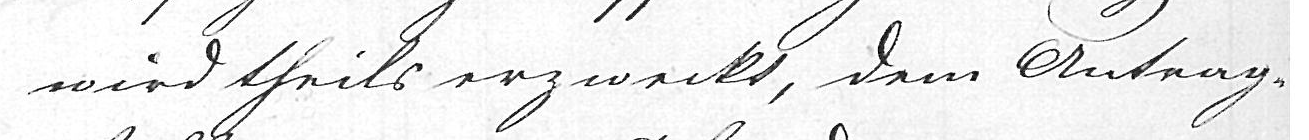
wird theils erzweckt, dem Antrag-
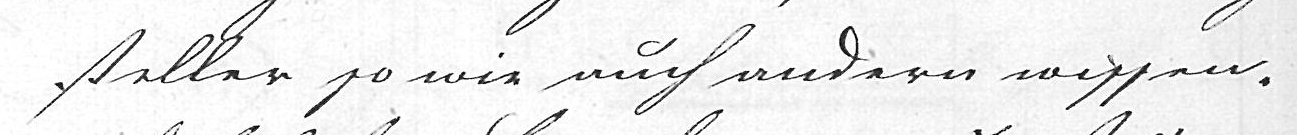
steller sowie auch andern wissen-
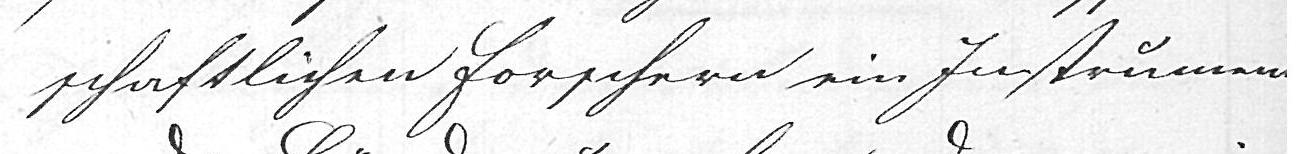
schaftlichen Forschern ein Instrument
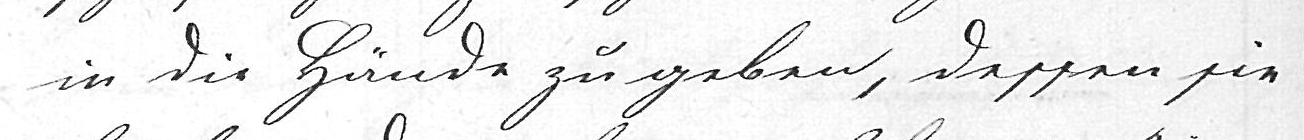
in die Hände zu geben, dessen sie
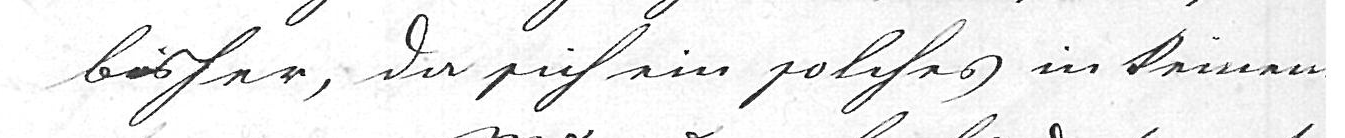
bisher, da sich ein solches in keinen
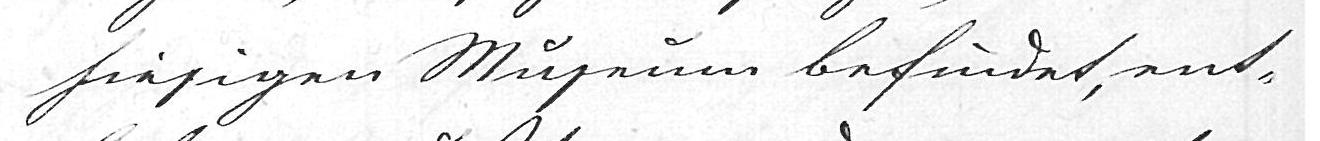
hiesigen Museum befindet, ent
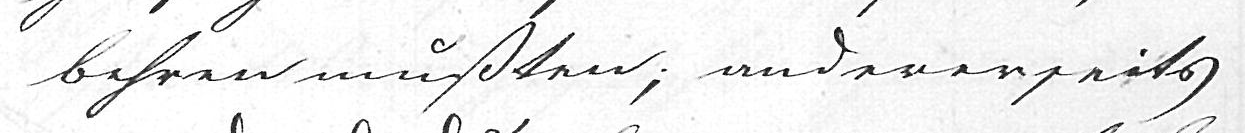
behren mußten; andererseits
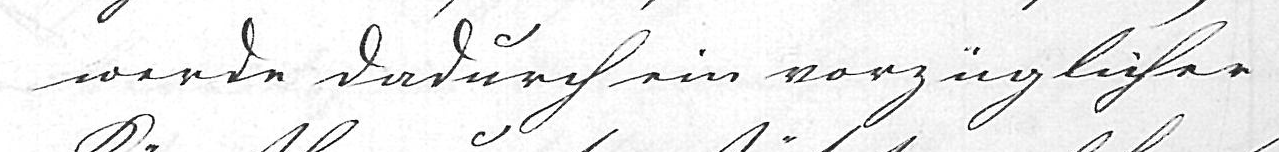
werde dadurch ein vorzüglicher
